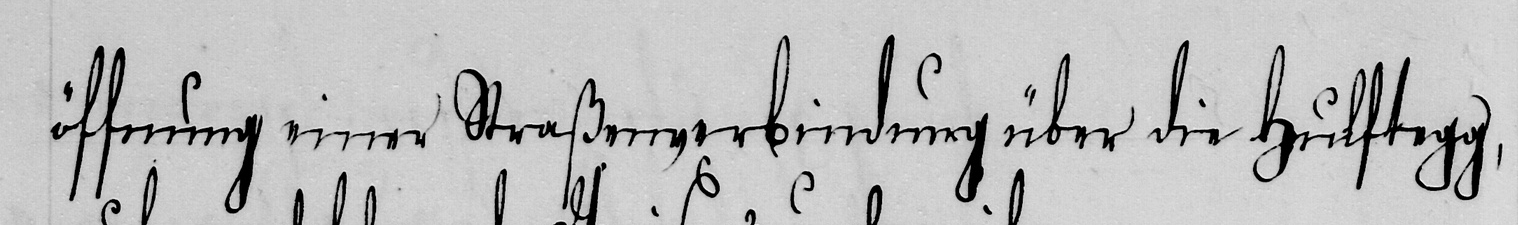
öffnung einer Straßenverbindung über die Hulftegg,
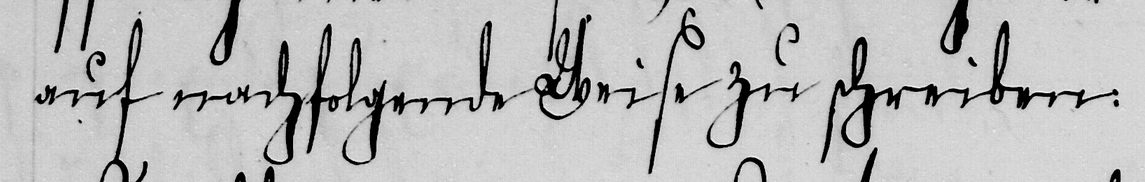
auf nachfolgende Weise zu schreiben.
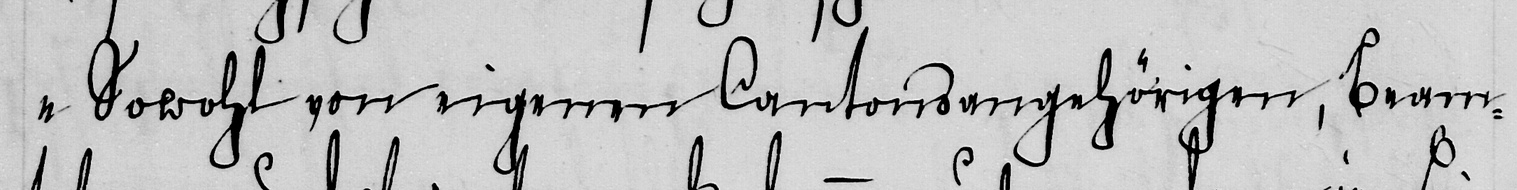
„Sowohl von eigenen Cantonsangehörigen, Beam¬
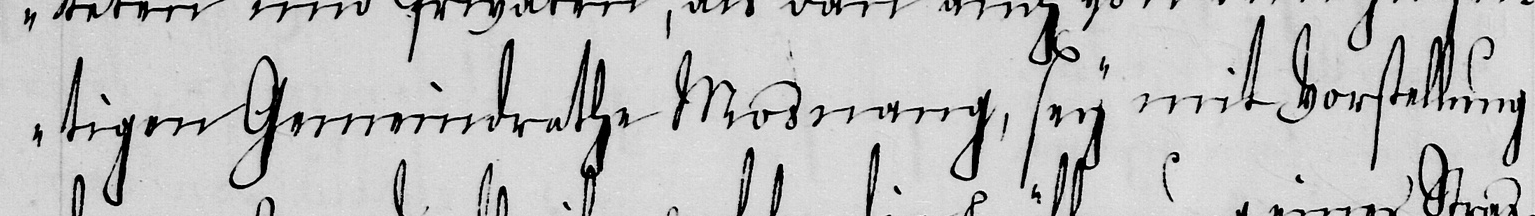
tigen Gemeindrathe Mosnang, sey mit Vorstellung
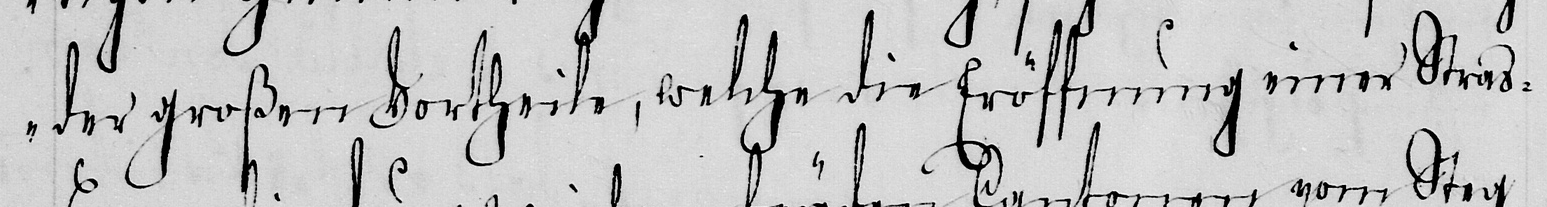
der großen Vortheile, welche die Eröffnung einer Straß¬
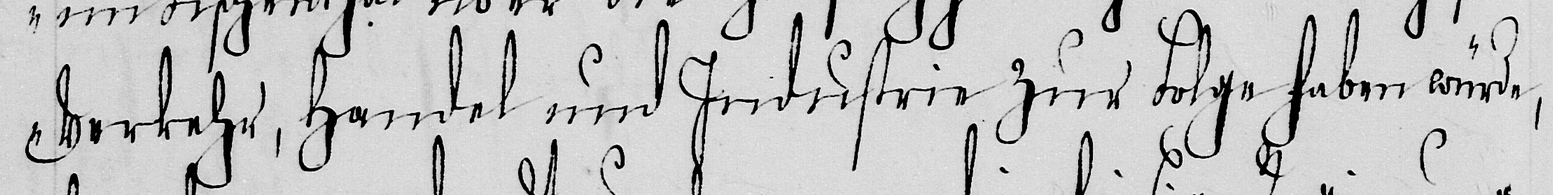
Verkehr, Handel und Industrie zur Folge haben würd¬
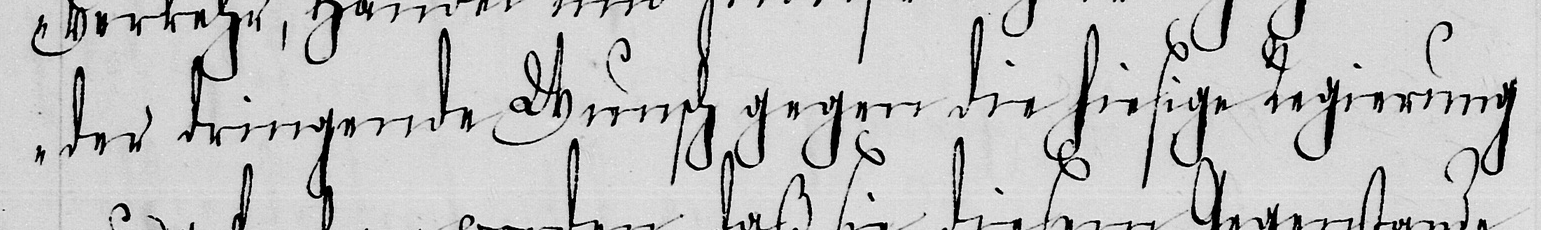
der dringende Wunsch gegen die hiesige Regierung
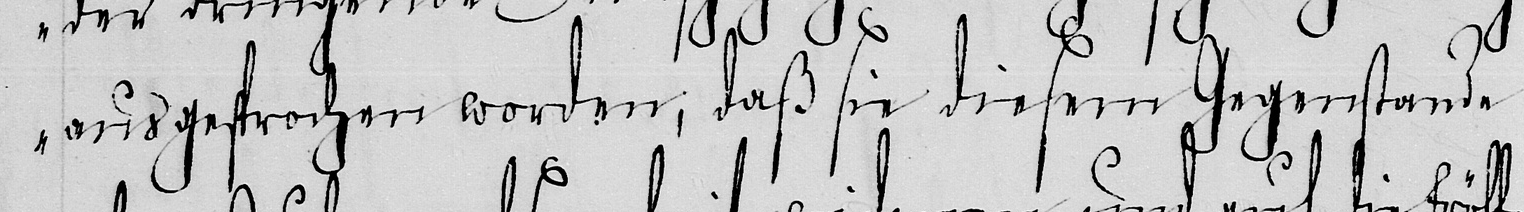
ausgesprochen worden, daß sie diesem Gegenstande
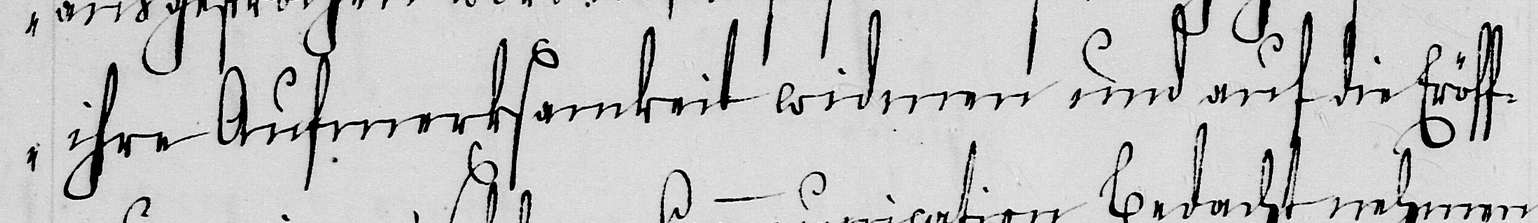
ihre Aufmerksamkeit widmen und auf die Eröf¬
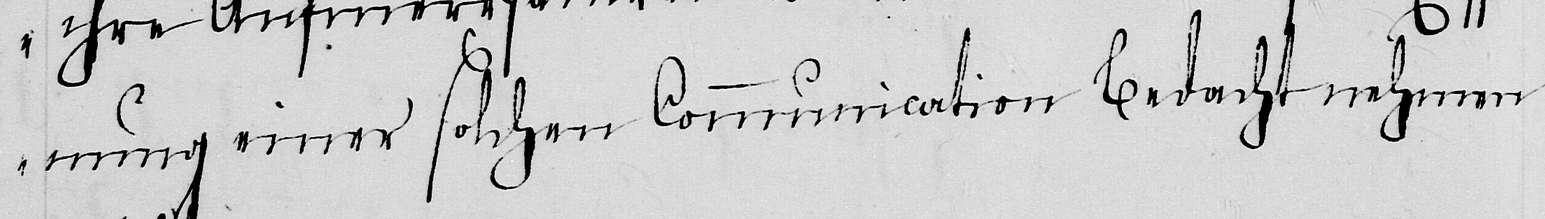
fnung einer solchen Communication Bedacht nehmen
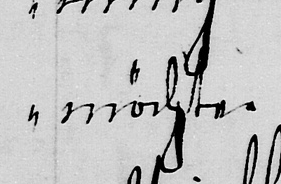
möchte.
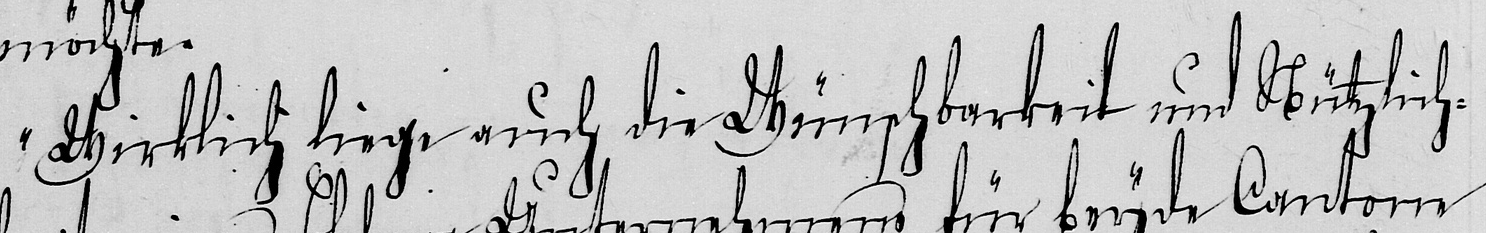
Wirklich liege auch die Wünschbarkeit und Nützlic¬
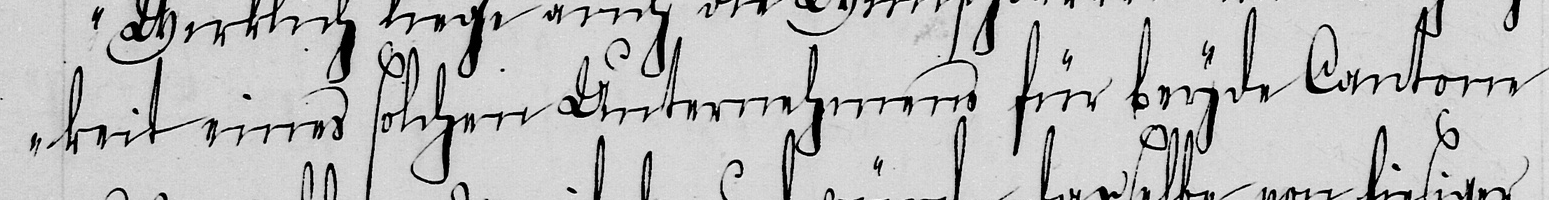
hkeit eines solchen Unternehmens für beyde Cantone
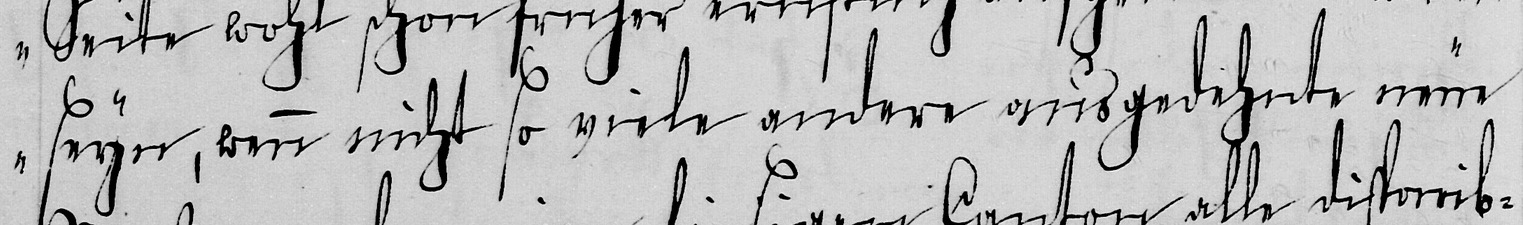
seyn, wenn nicht so viele andere ausgedehnte neue
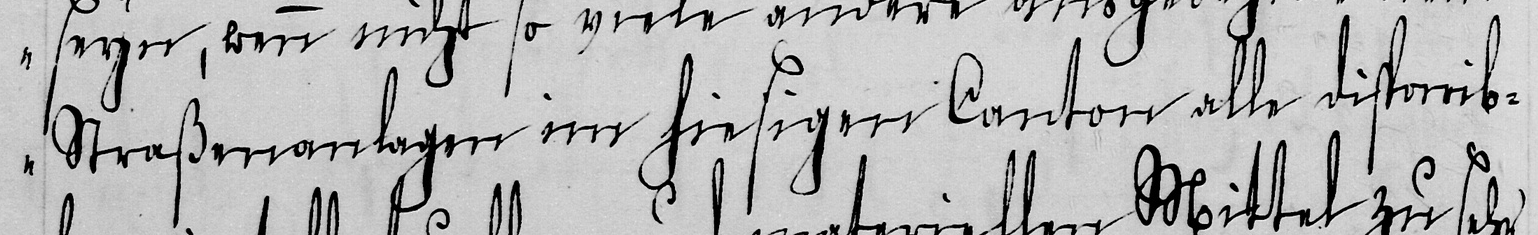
Straßenanlagen im hiesigen Canton alle disponib¬
